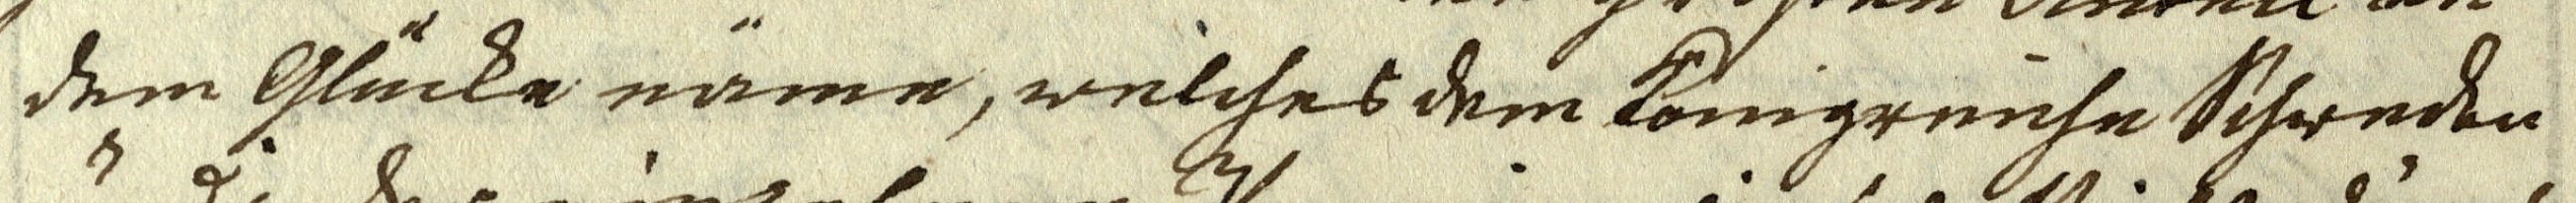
dem Glücke näme, welches dem Königreiche Schweden
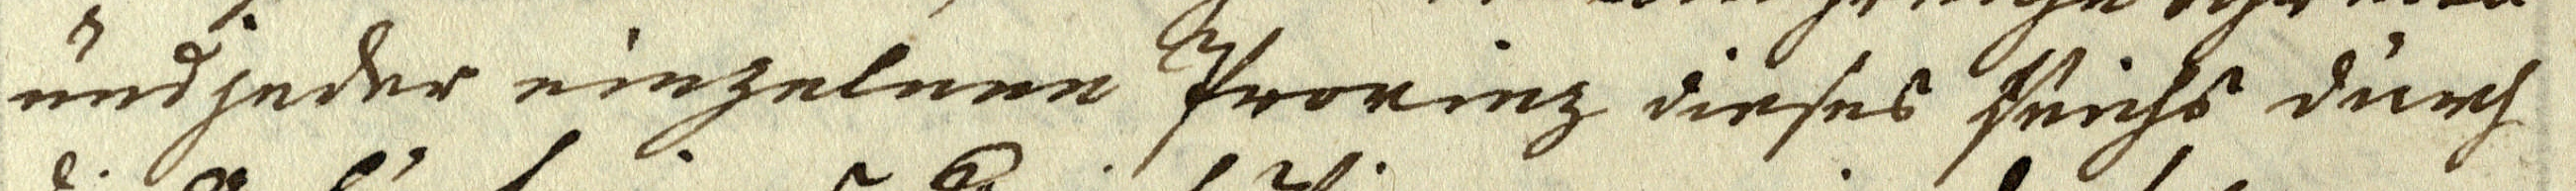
und jeder einzelnen Provinz dieses Reichs durch
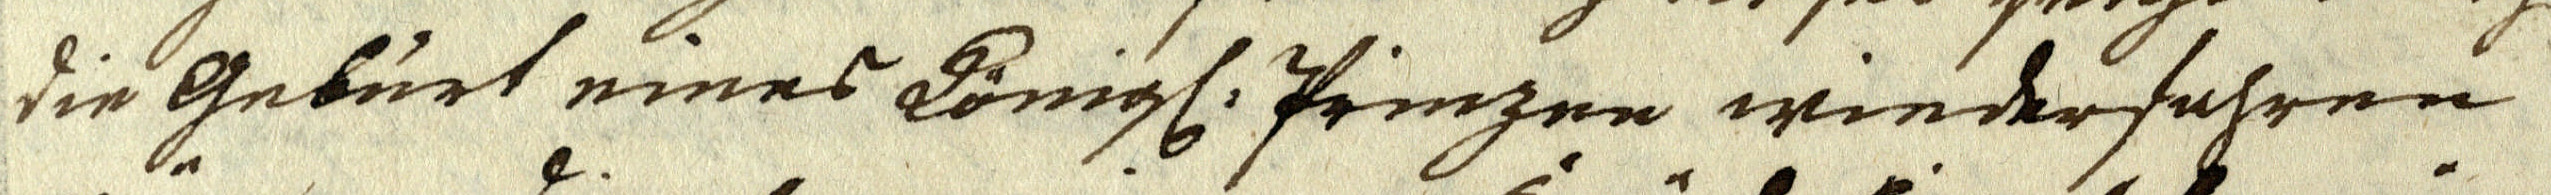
die Geburt eines Königl. Prinzen wiederfahren
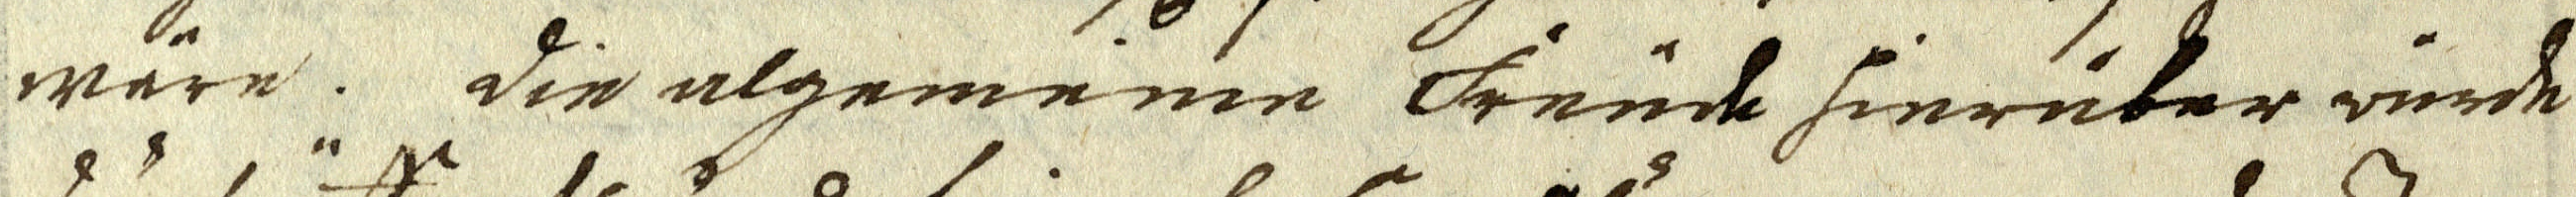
wäre. Die algemeine Freude hierüber würde
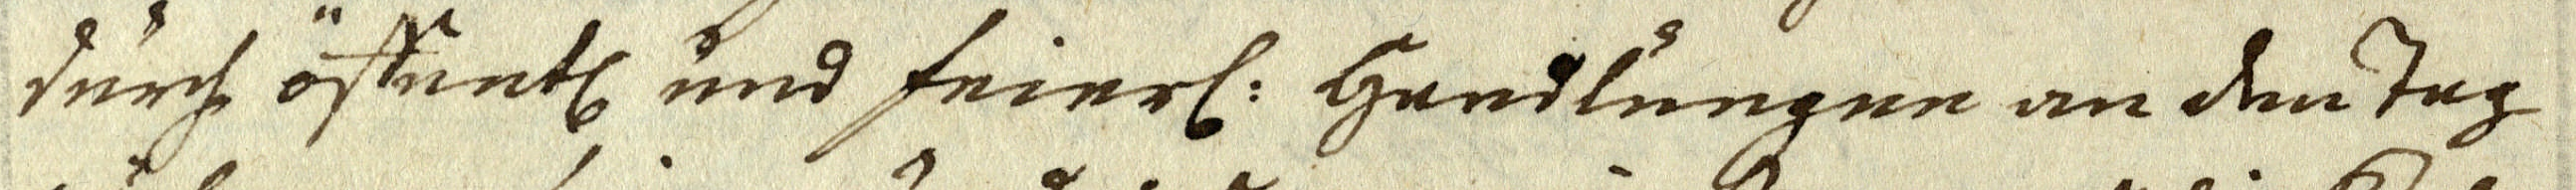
durch öffentl. und feierl. Handlungen an den Tag
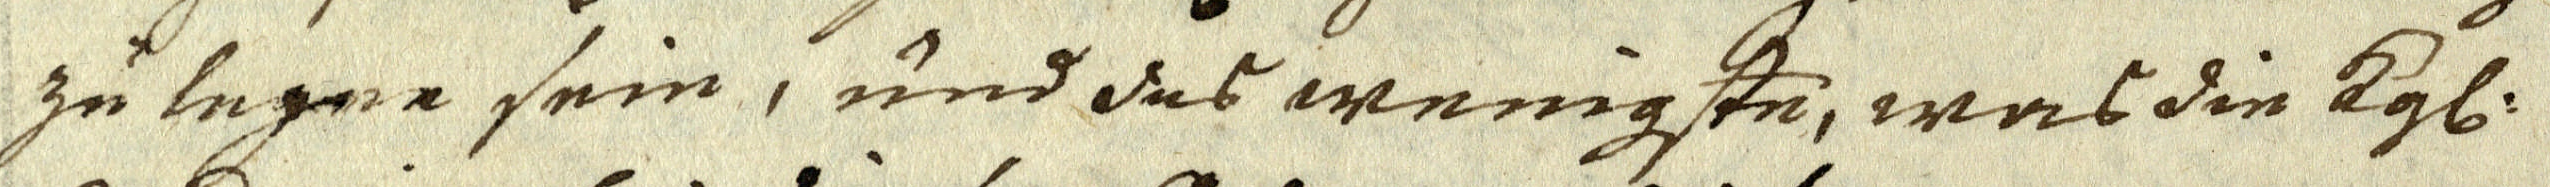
zu legen sein, und das wenigste, was die Kgl.
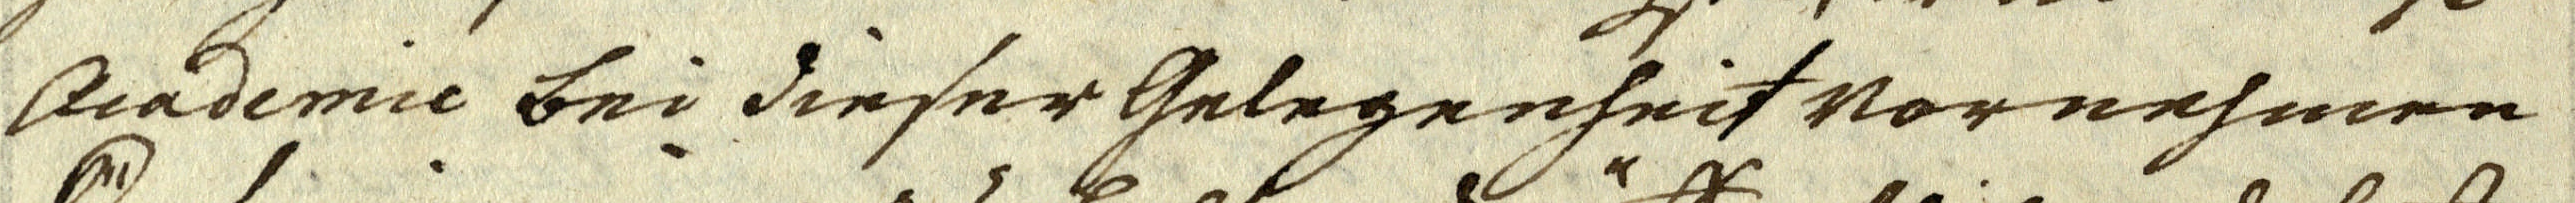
Academie bei dieser Gelegenheit vornehmen
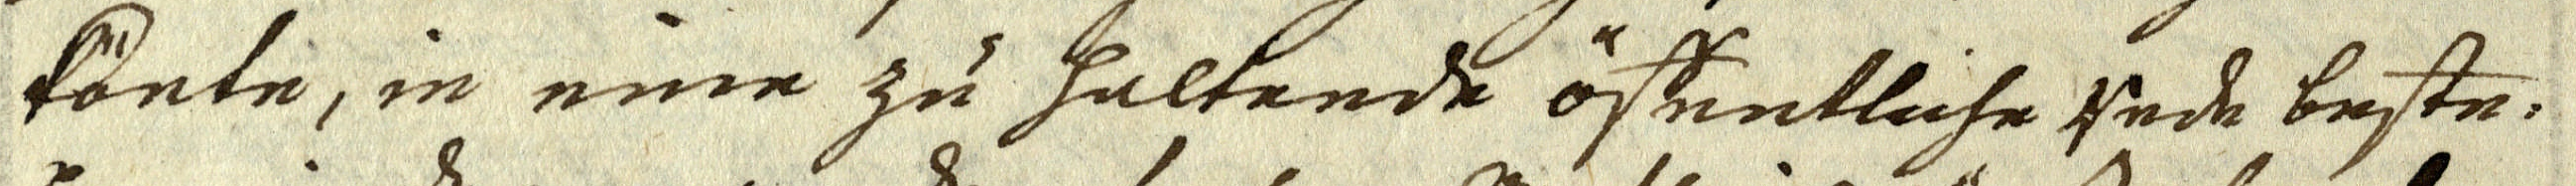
könte, in eine zu haltende öffentliche Rede beste¬
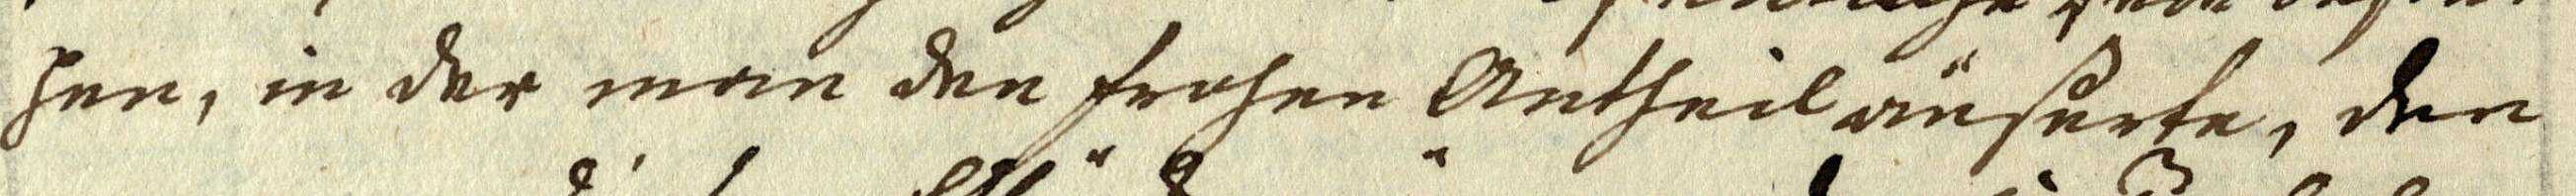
hen, in der man den frohen Antheil äußerte, den
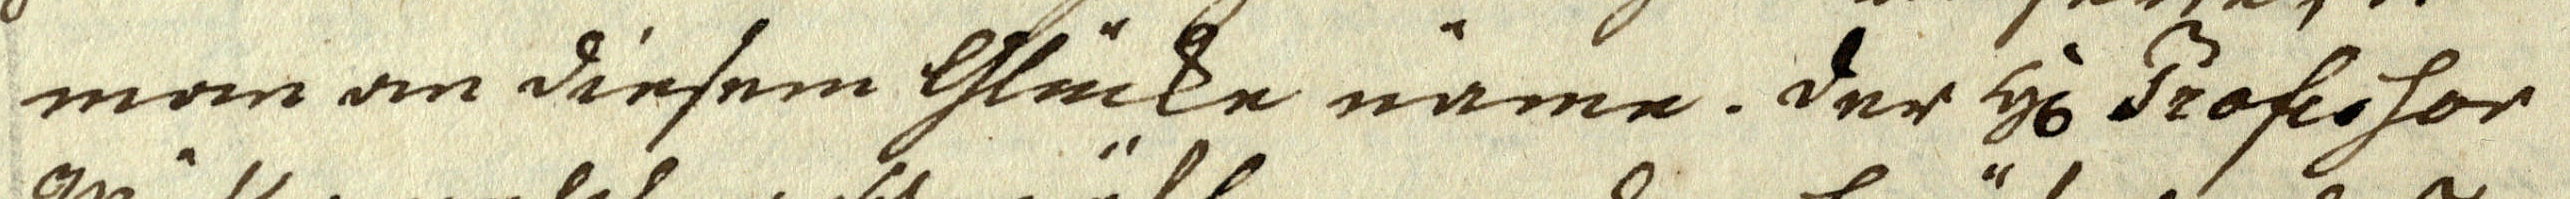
man an diesem Glücke näme. Der H. Professor
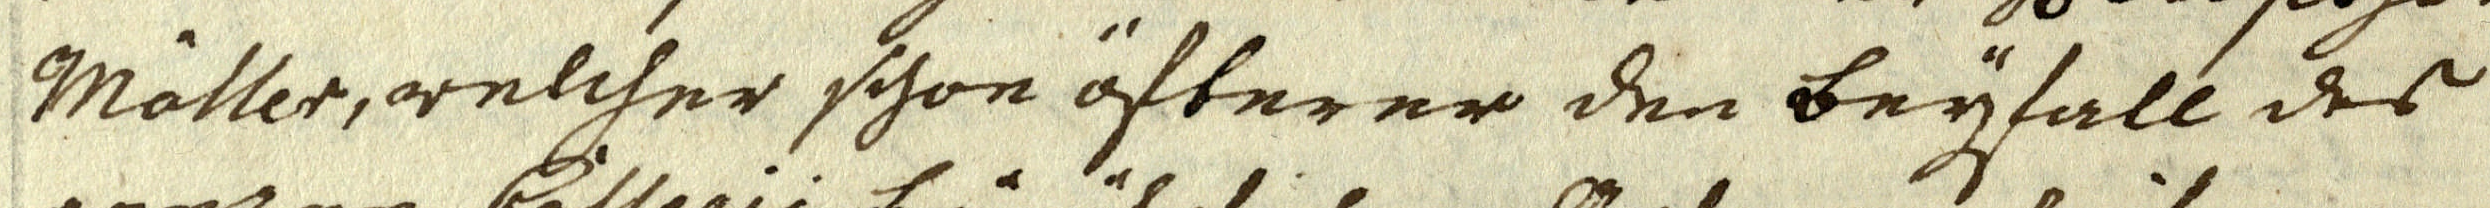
Möller, welcher schon öfterer den Beÿfall des
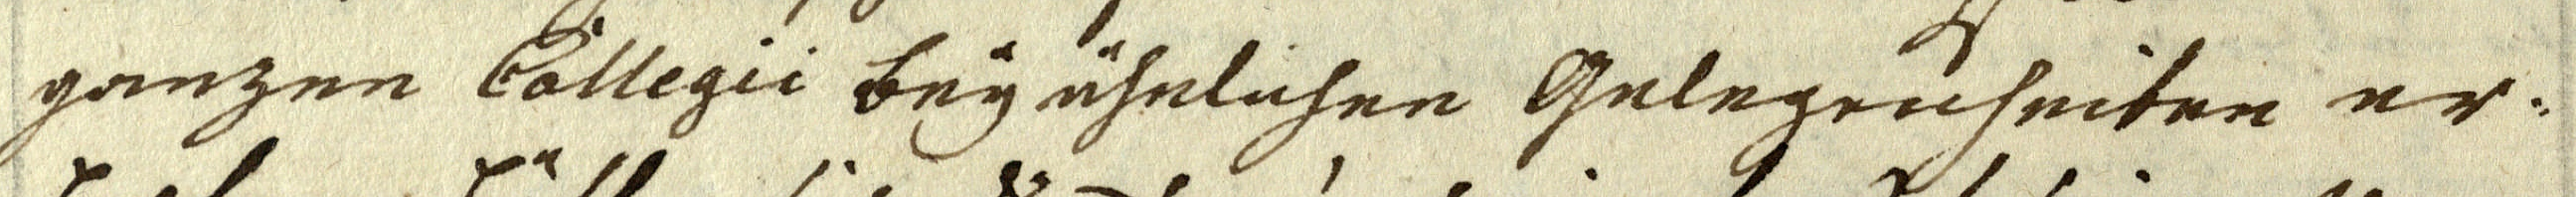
ganzen Collegii beÿ ähnlichen Gelegenheiten er¬
